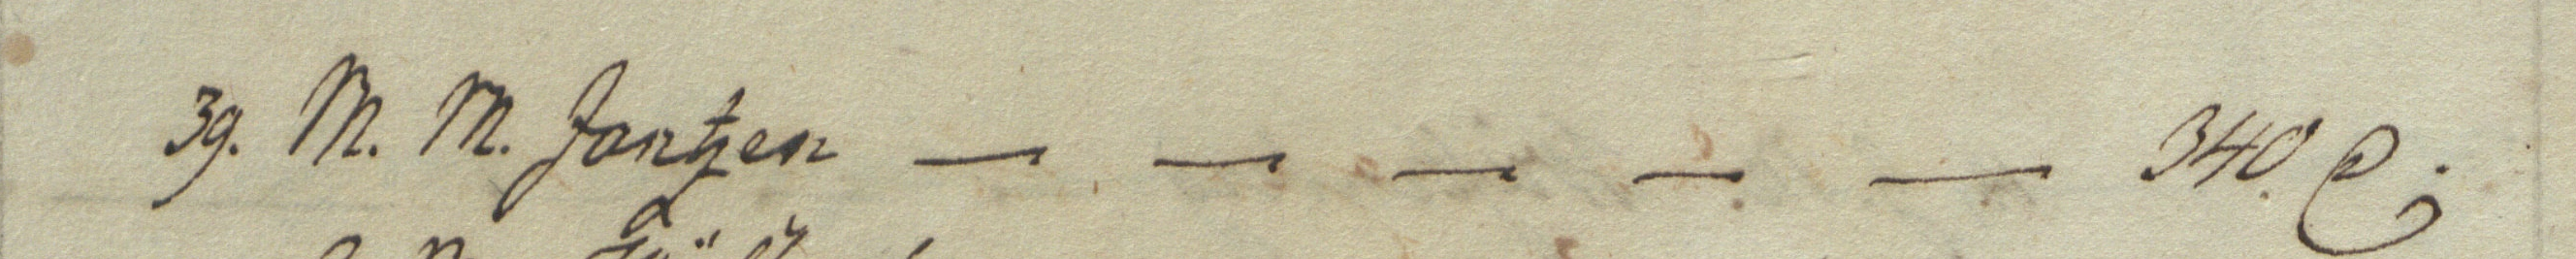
39. M. M. Jantzen ----- 340 rtl.
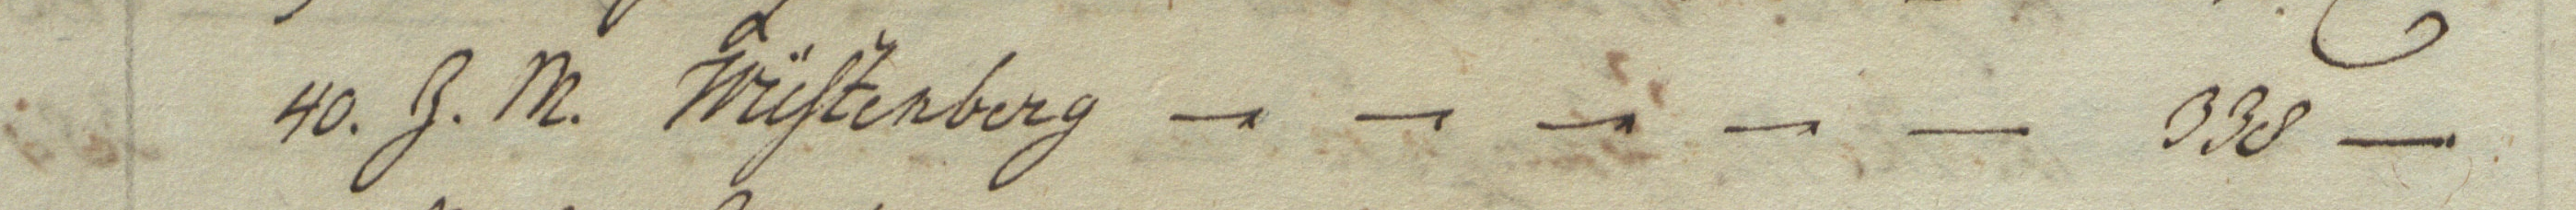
40. Z. M. Wüstenberg ----- 338 -
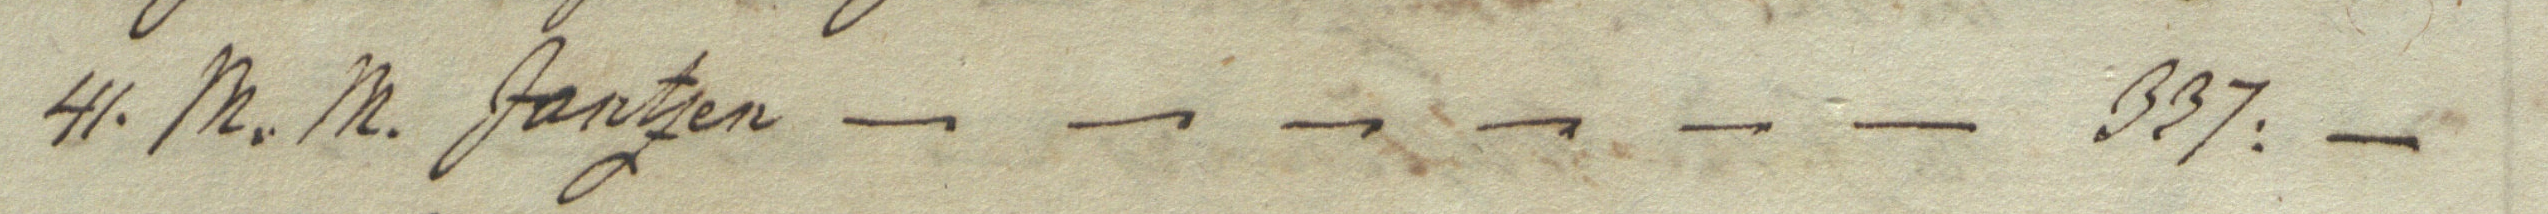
41. M. M. Jantzen ------ 337: -
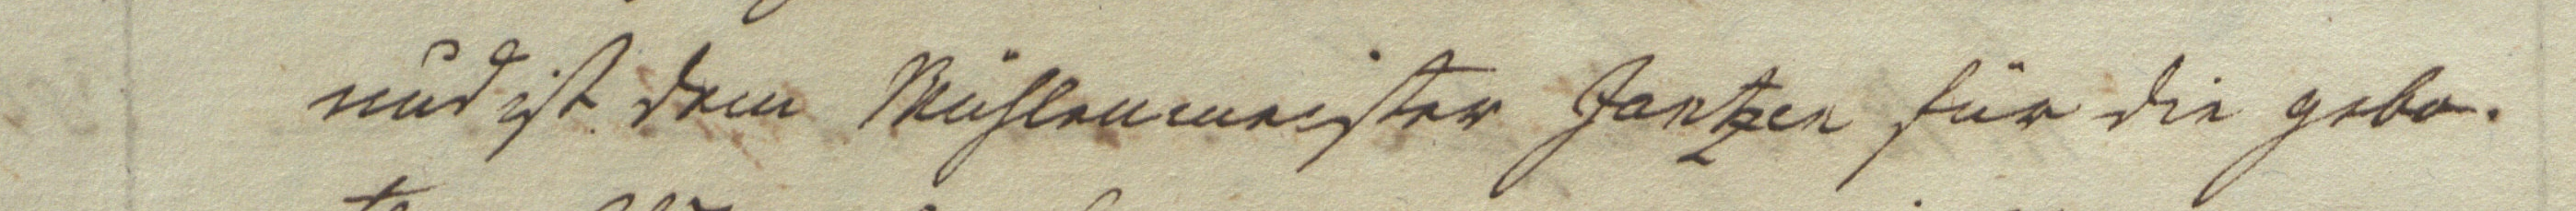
und ist dem Mühlenmeister Jantzen für die gebo¬
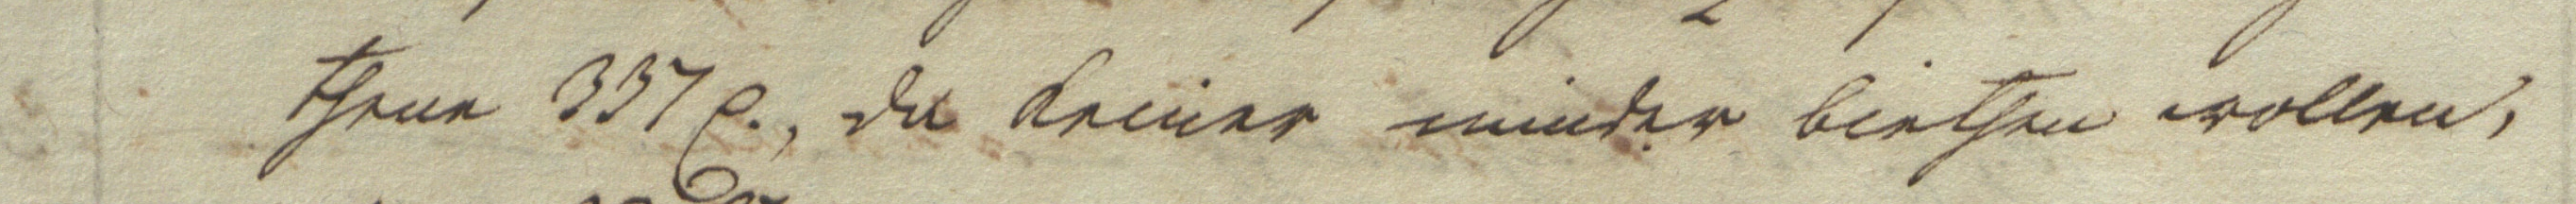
thene 337 rtl., da keiner minder biethen wollen,
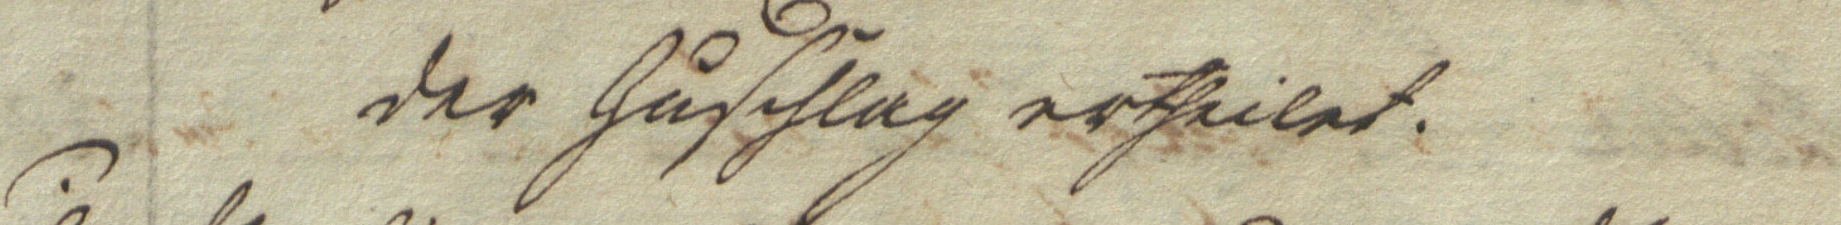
der Zuschlag ertheilet.
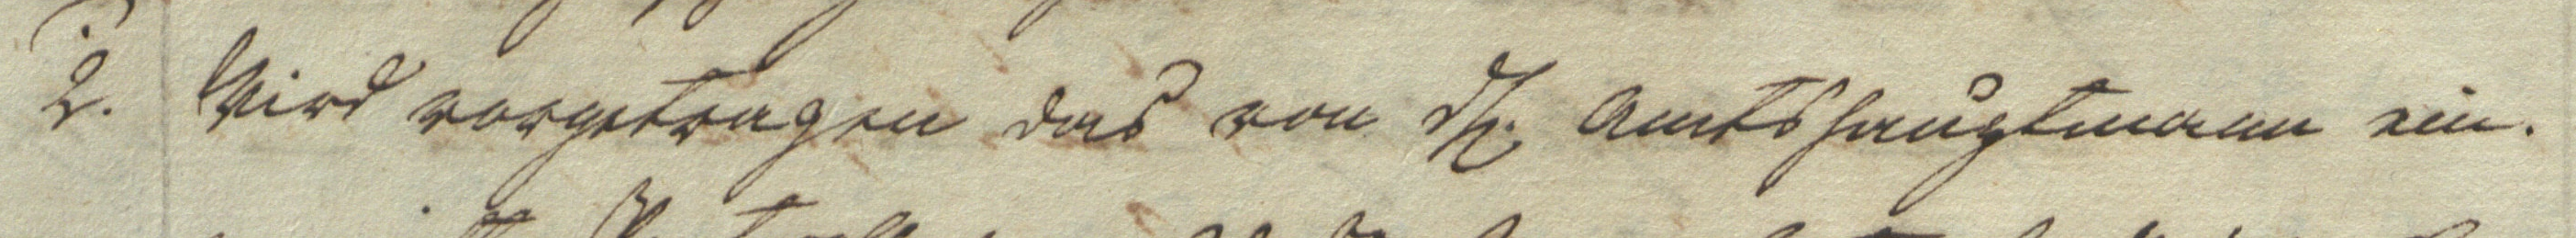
2. Wird vorgetragen das von dh. Amtshauptmann ein¬
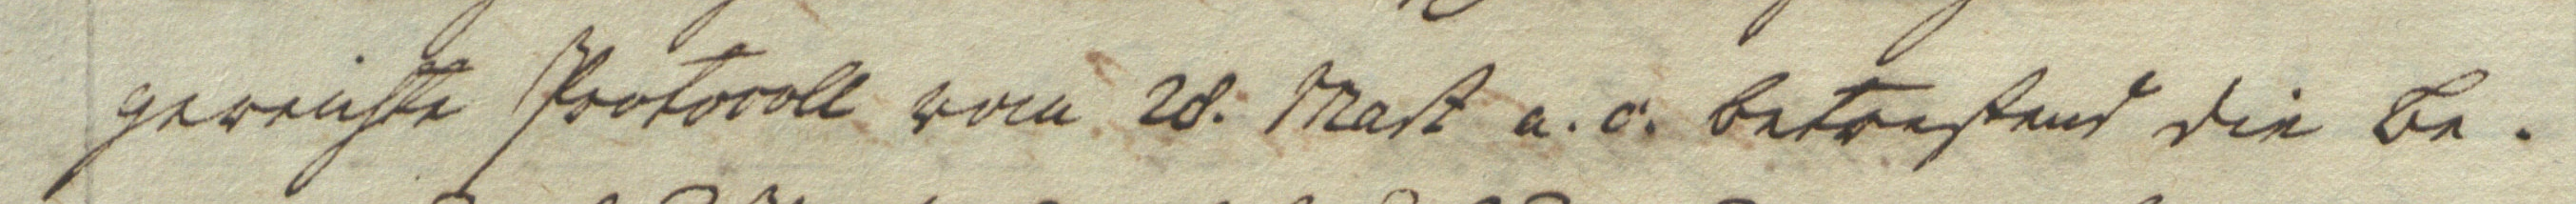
gereichte Protokoll vom 28. Mart a.c. betreffend die Be¬
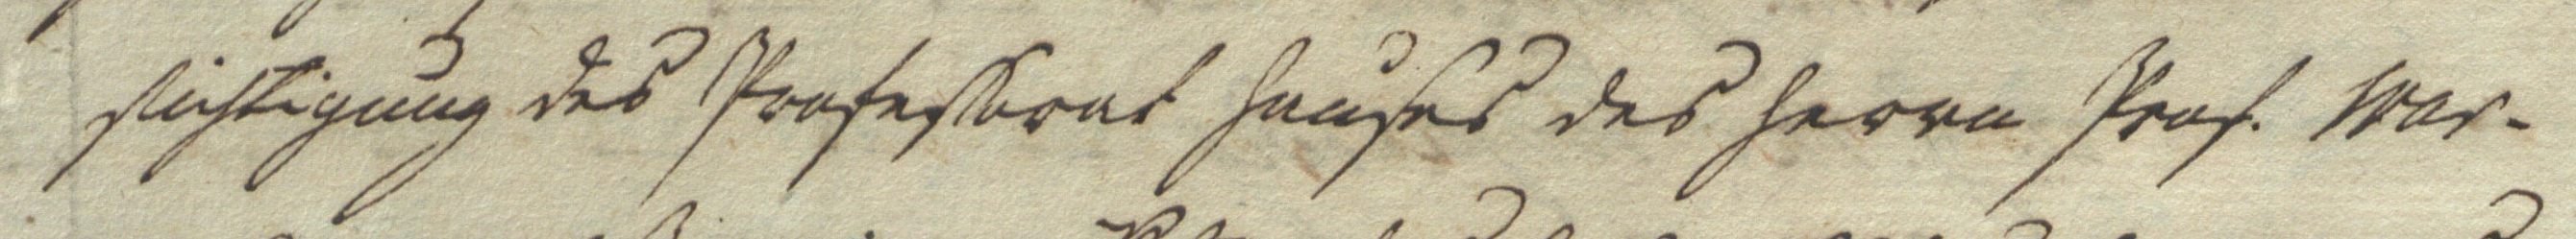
sichtigung des Professorat hauses des Herrn Prof. War¬
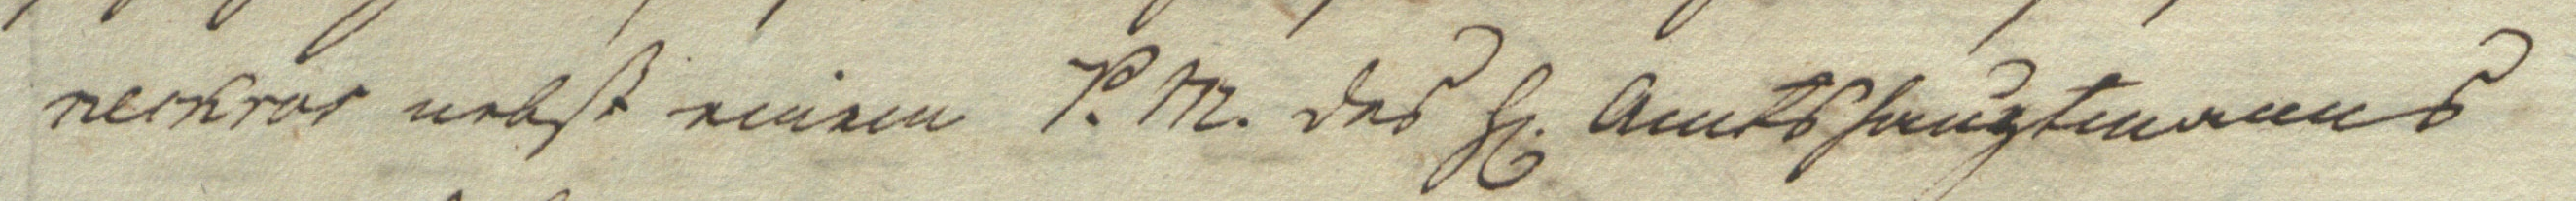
nekros nebst einem P. M. des H. Amtshauptmanns
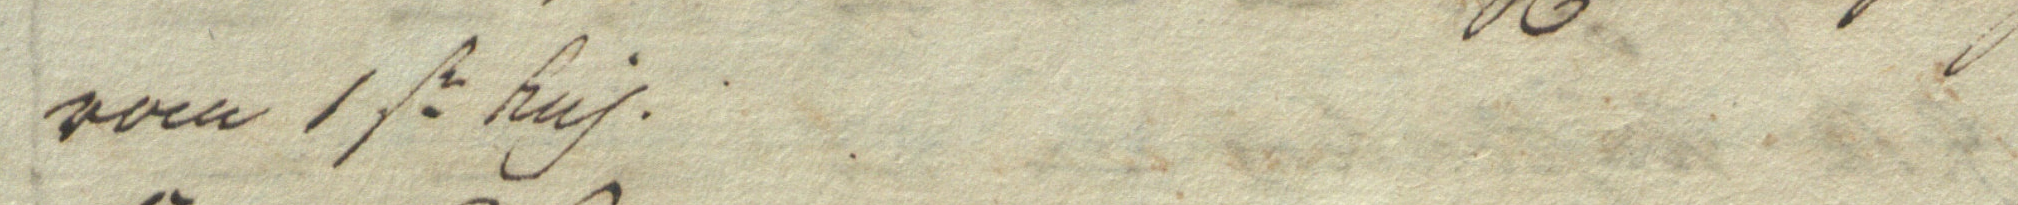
vom 1 st. huj.
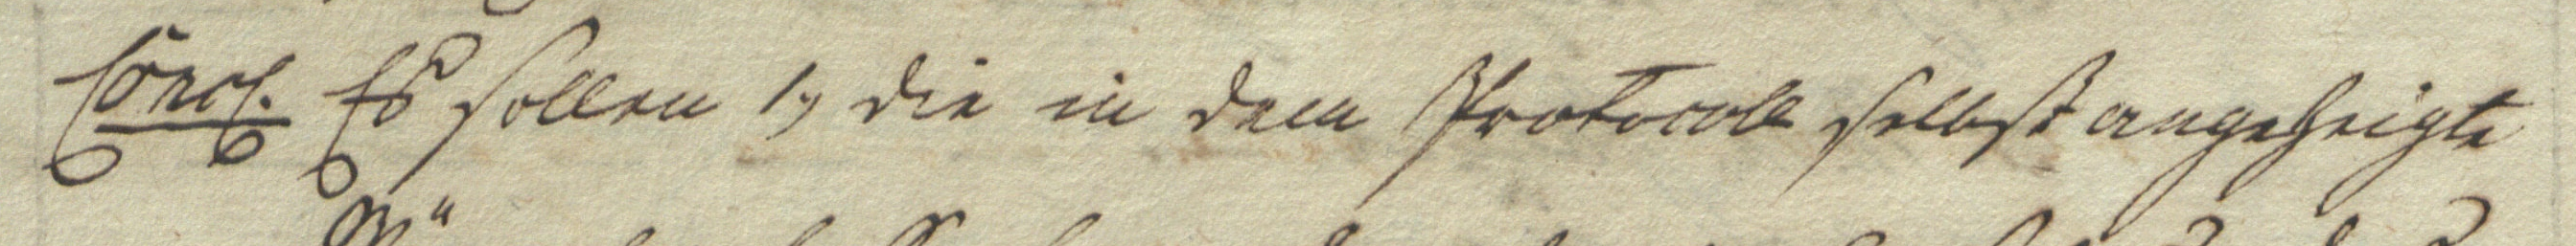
Concl. Es sollen 1., die in dem Protocoll selbst angezeigte
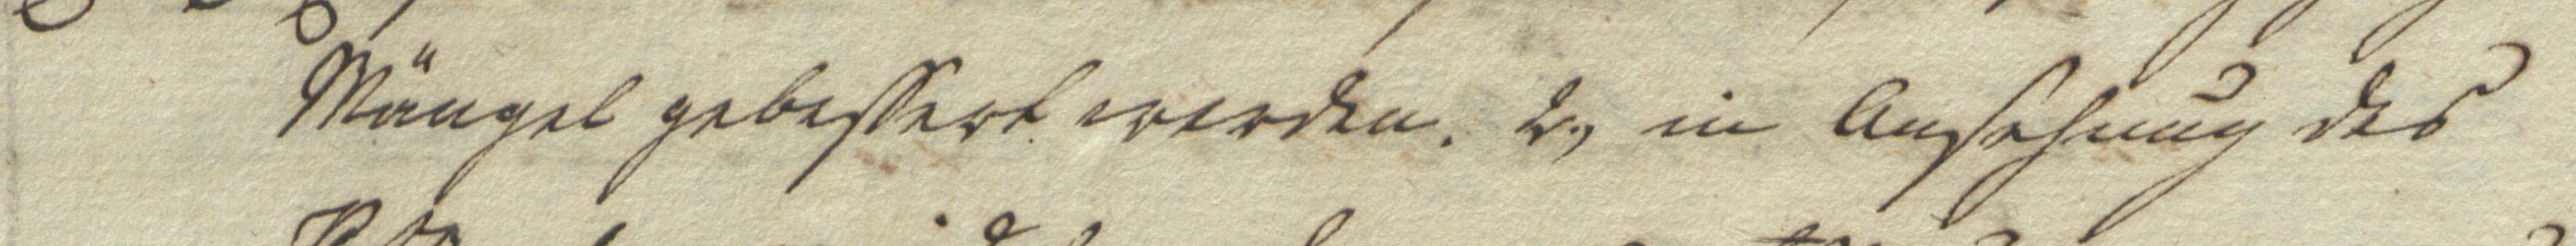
Mängel gebessert werden. 2., in Ansehung des
